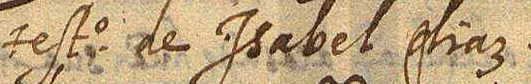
test.o de Jsabel diaz.
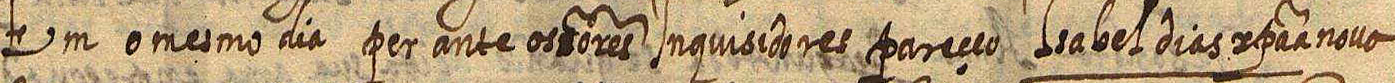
Em o mesmo dia perante os s̄ores Inquisidores pareçeo Isabel dias xpāa noua
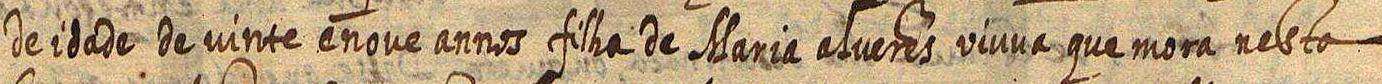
de idade de uinte e noue annos filha de Maria aluerēs viuua que mora nesta
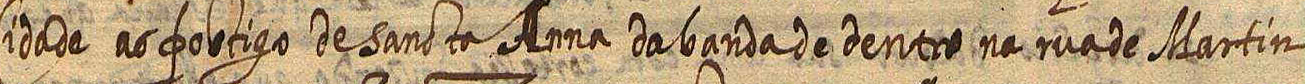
Cidade ao postigo de sancta Anna da banda de dentro na rua de Martin
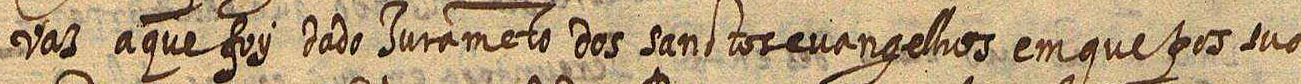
vaz a que foy dado Iuramēto dos sanctos euangelhos em que pos sua
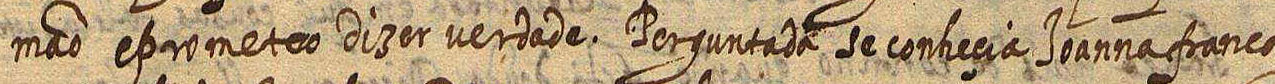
mão e prometeo dizer uerdade. Perguntada se conheçia Ioanna franca
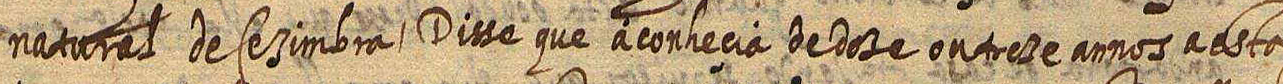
natural de Cezimbra / Disse que a conheçia de doze ou treze annos a esta
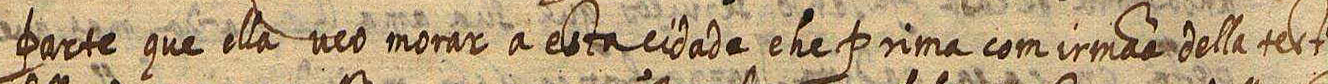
parte que ella ueo morar a esta çidade e he prima com irmāa della testa
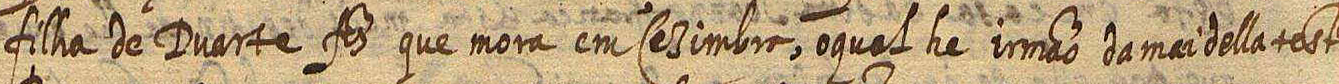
filha de Duarte fr̄z que mora em Cezimbra, o qual he irmão da mai della testa.
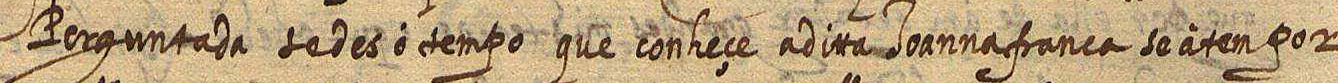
Perguntada se des o tempo que conheçe a ditta Ioanna franca se a tem por
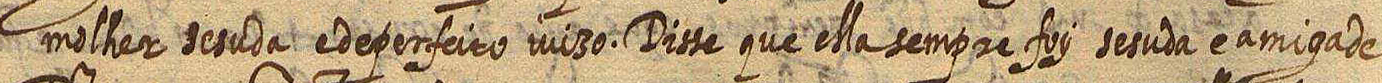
molher sesuda e de perfeito iuizo. Disse que ella sempre foy sesuda e amiga de
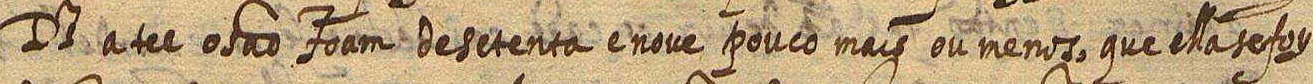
Ds̄ atee o são Ioam de setenta e noue pouco mais ou menos, que ella se foy
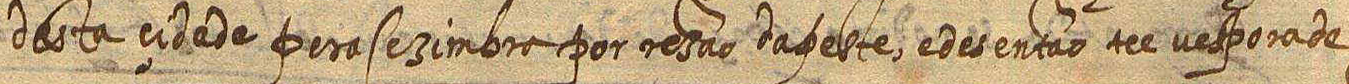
desta çidade pera Cezimbra por rezão da peste, e des então tee uespora de
